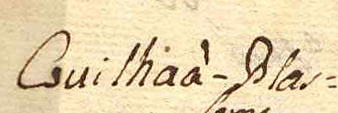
Couilhaã - Blas
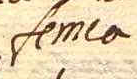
femea
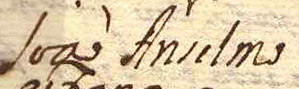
loaõ Anselmo
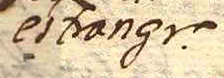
estrangr.o
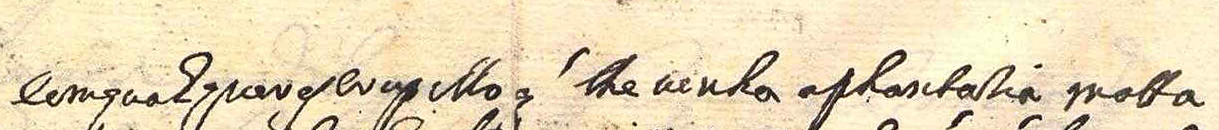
com qualquer escrupello q̄ lhe uenha a phantazia matta
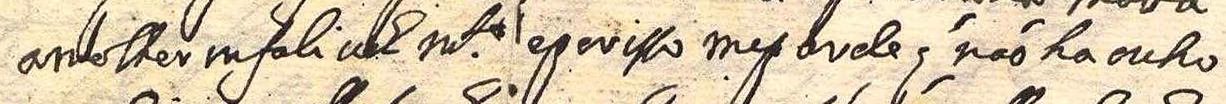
a molher infaliuelm.te e por isso me parece q̄ naõ ha outro
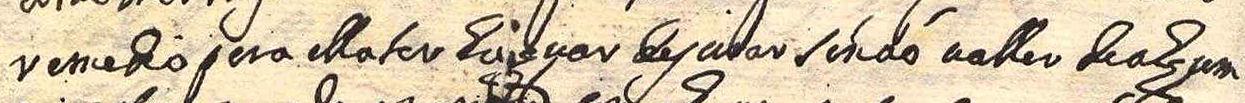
remedio pera ella ter luguar de jurar sendo ualler de algum
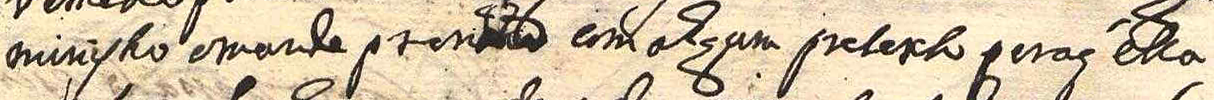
ministro e mande prender com algum pretexto pera q̄ ella
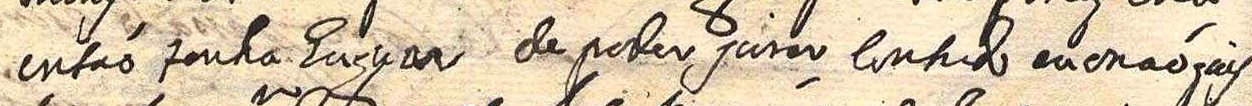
entaõ tenha luguar de poder jurar, contudo ou o naõ quis
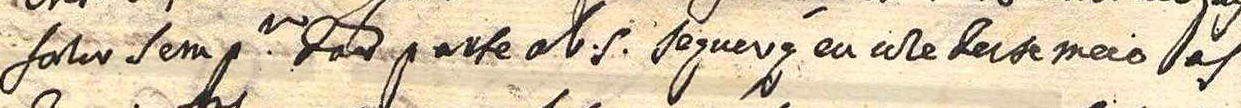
fazer sem p.ro dar parte a V. s. sequer q̄ eu uze deste meio as
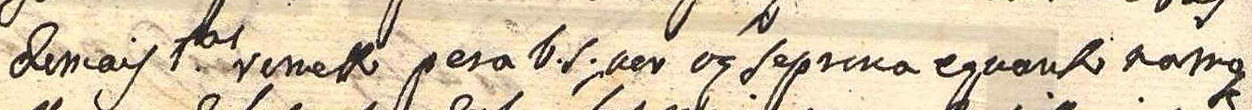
demais t.as remetto pera V. S. uer o q̄ se proua e quanto na mo
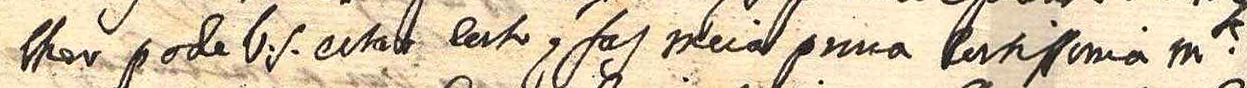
lher pode V. S. estar certo q̄ faz meia proua certissimamte.
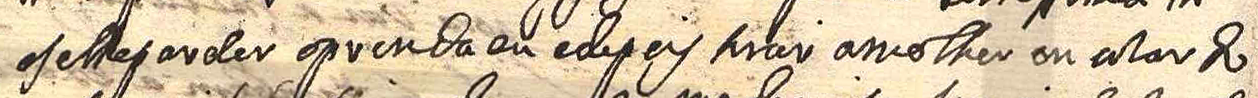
e se lhe parder o prenda eu e depois tirar a molher ou estar do
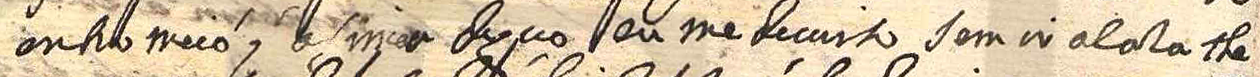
outro meio q̄ asinar diguo eu me deuirto sem ir a caza the
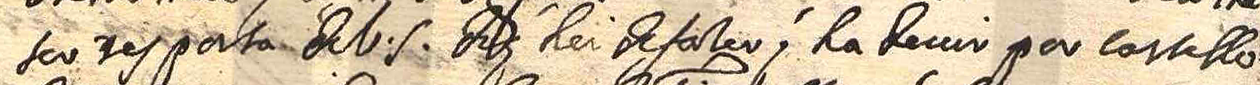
ter resposta de V. S. de q̄ hei de fazer q̄ ha de uir por castello
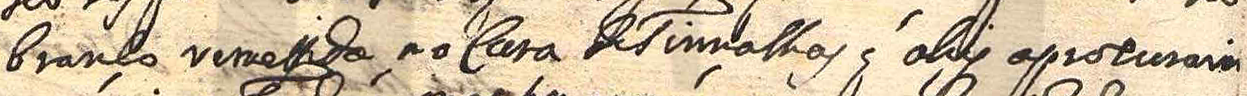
branco remettida ao Cura de Tinnalhas q̄ ahy a procurarei
